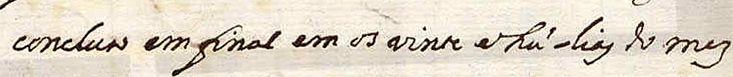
concluso em final em os vinte e hū dias do mez
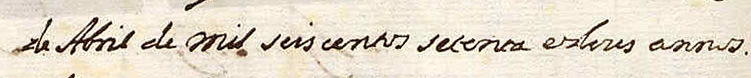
de Abril de mil seiscentos setenta e dous annos.
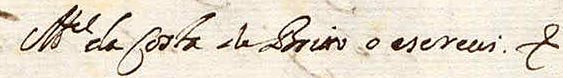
M.el da Costa Britto o escreui. &
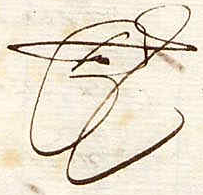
CLo
